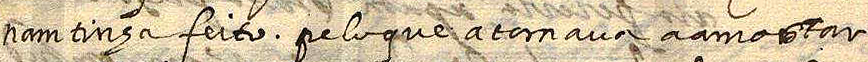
nam tinha feito. pelo que a tornaua a amoestar
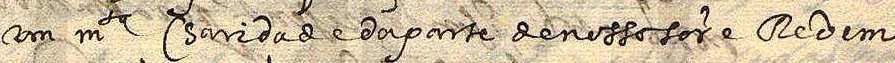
com mta Charidade da parte de nosso sor̄ e Redem
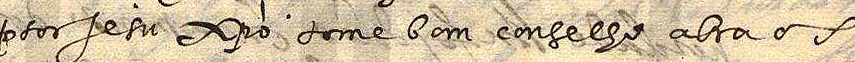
ptor Jesu Xpō tome bom conselho abra os
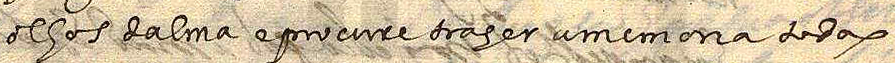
olhos dalma e procure trazer a memoria todas
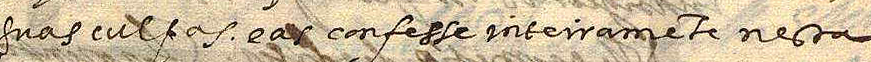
suas culpas. e as confesse inteiramēte nesta
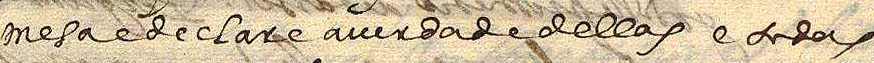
mesa e declare a uerdade dellas e todas
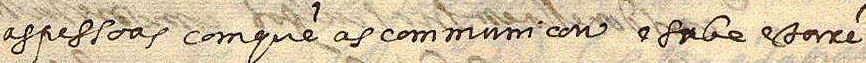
as pessoas com quē as communicou e sabe estarē
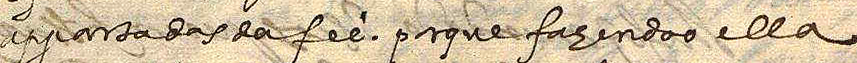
appartadas da feé. porque fazendoo ella
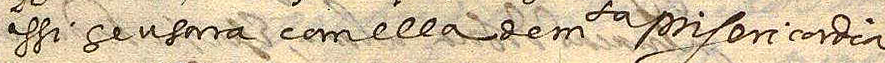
assi se usara com ella de mta Misericordia
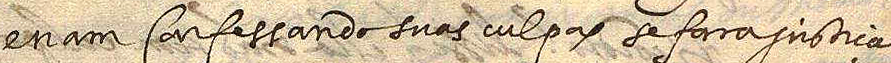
e nam Confessando suas culpas se fara justiça
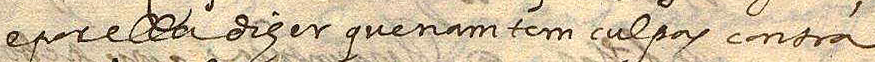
e por ella dizer que nam tem culpas contra
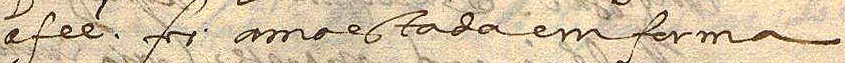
a feé. foi amoestada em forma
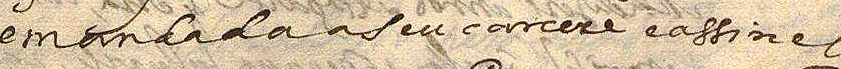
e mandada a seu carcere e assinei
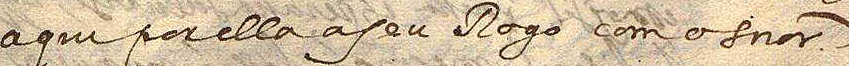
aqui por ella a seu Rogo com o snor̄
